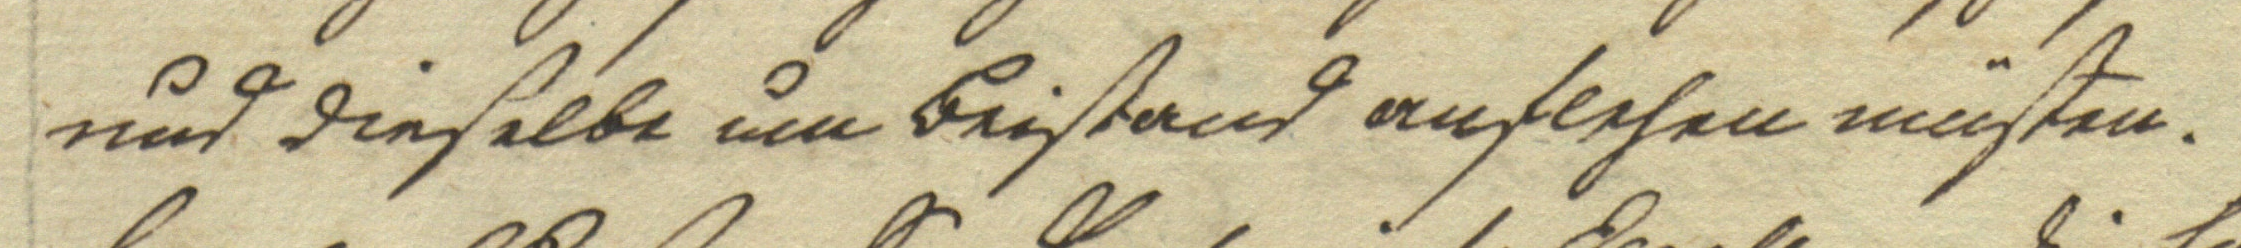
und dieselbe um Beistand anflehen müßten.
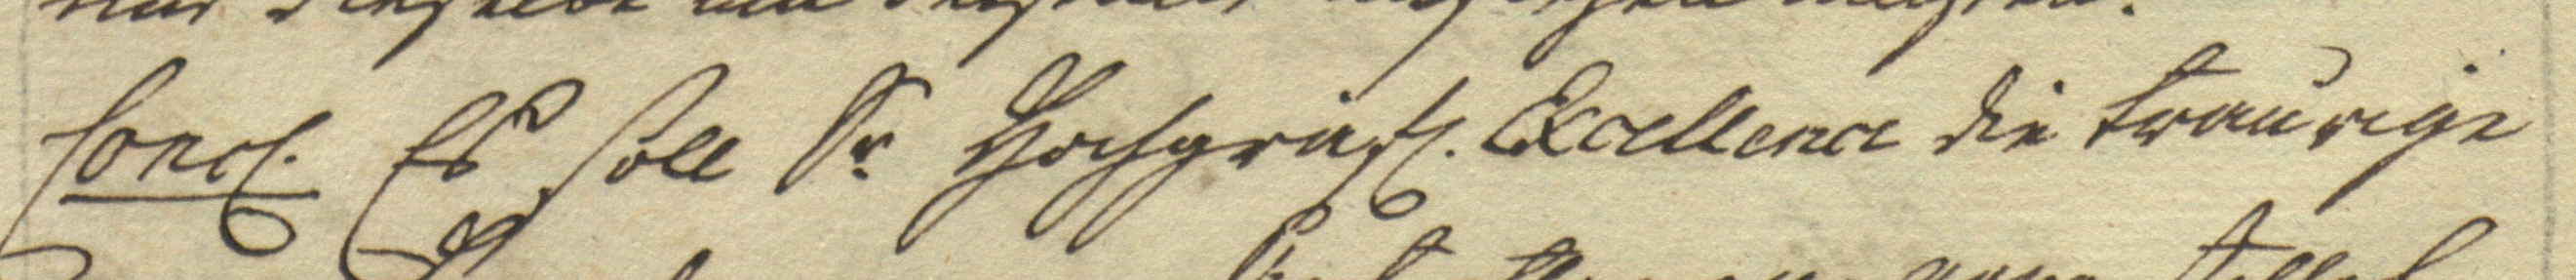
Concl. Es soll Sr Hochgräfl. Excellence die traurige
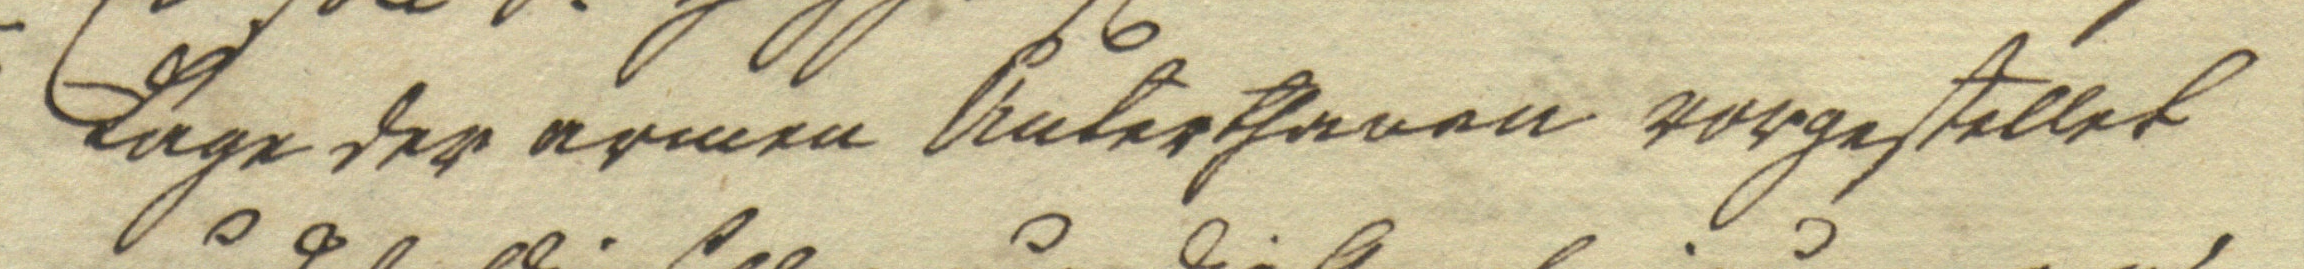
Lage der armen Unterthanen vorgestellet
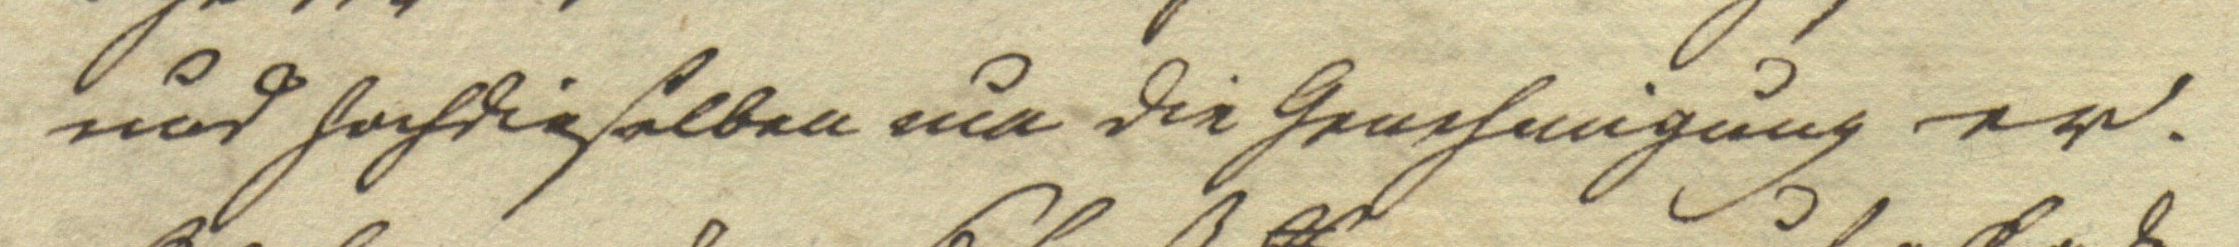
und Hochdieselben um die Genehmigung er¬
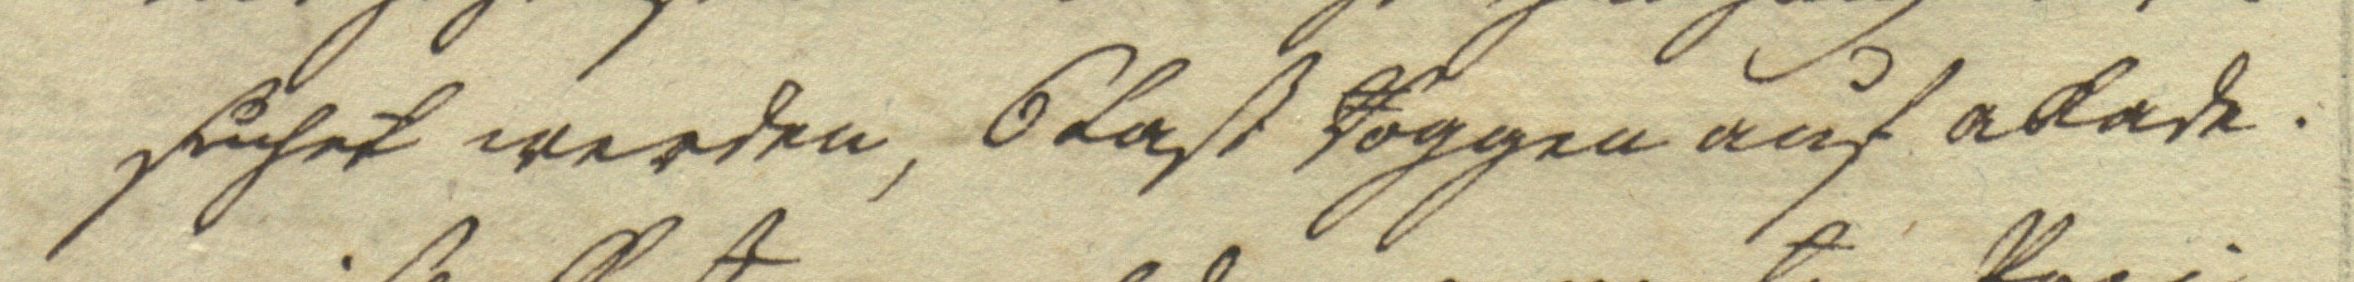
suchet werden, 6 Last Roggen auf akade¬
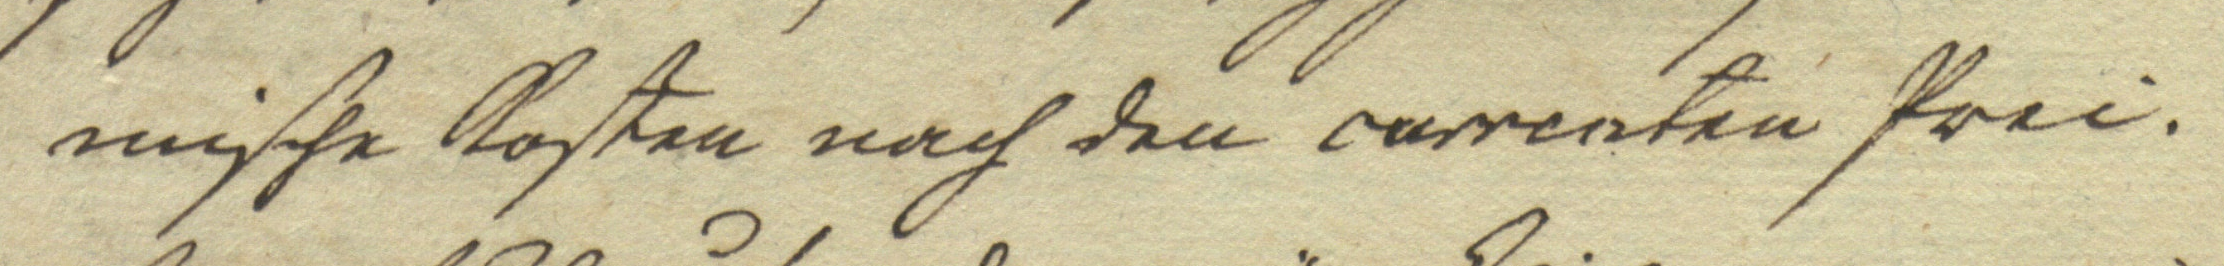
mische Kosten nach den currenten Prei¬
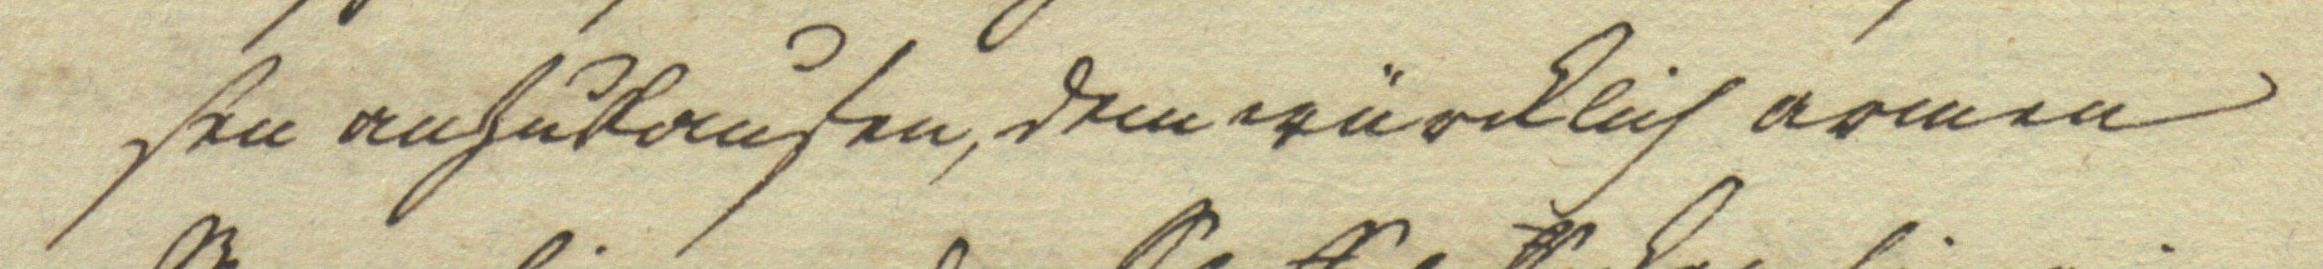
sen anzukaufen, dem würcklich armen
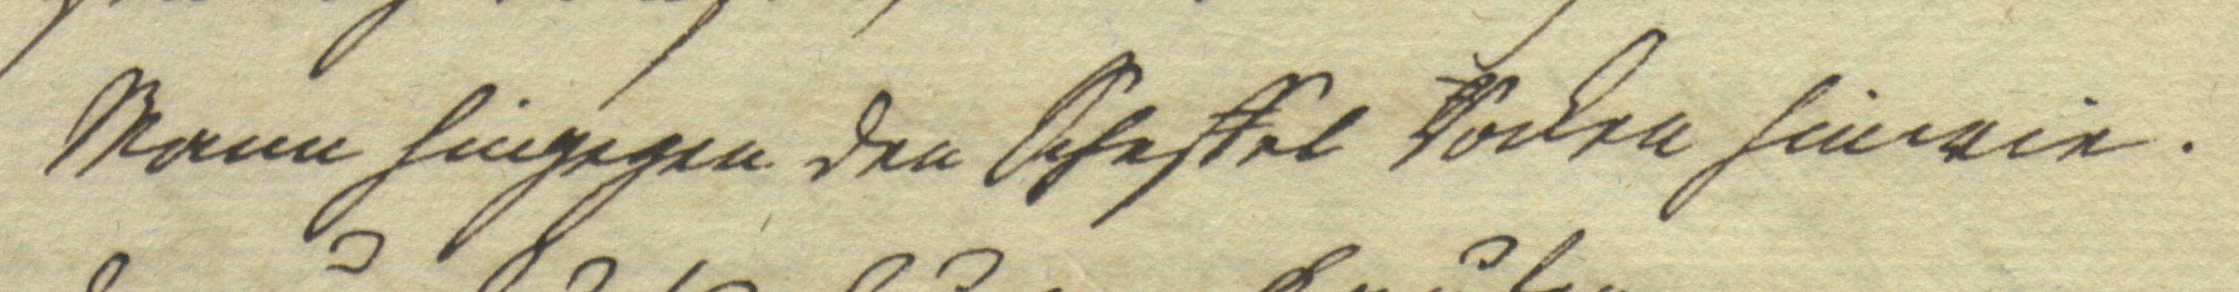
Mann hingegen den Scheffel Rocken hinwie¬
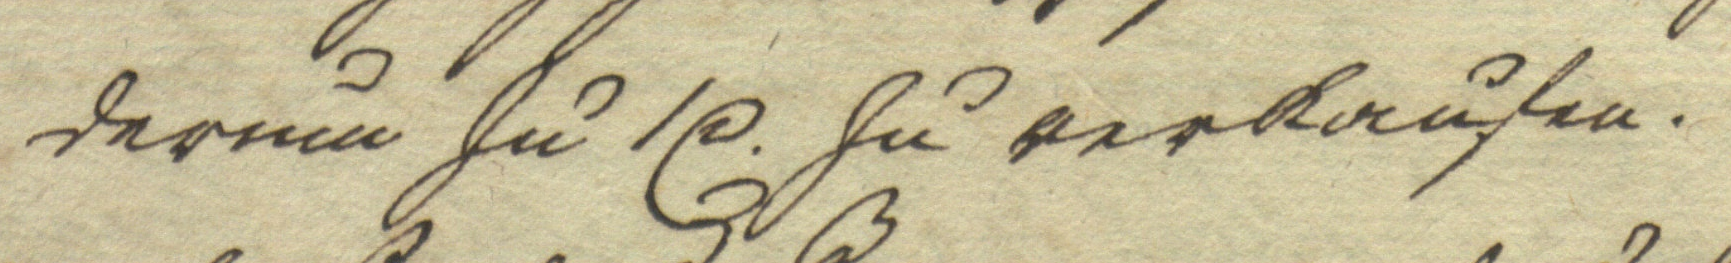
derum zu 1 l. zu verkaufen.
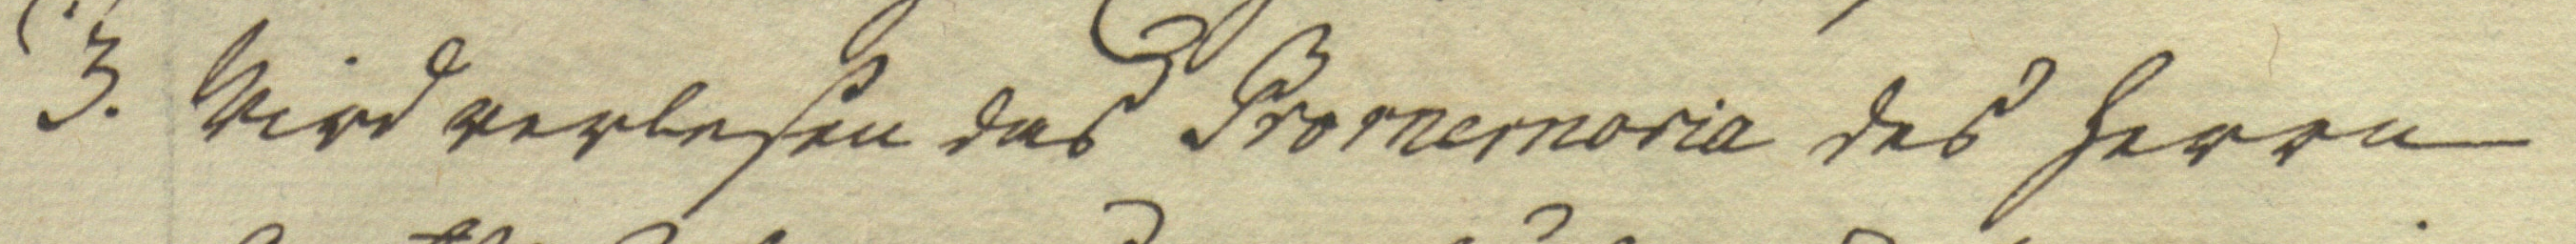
3. Wird verlesen das Promemoria des Herrn
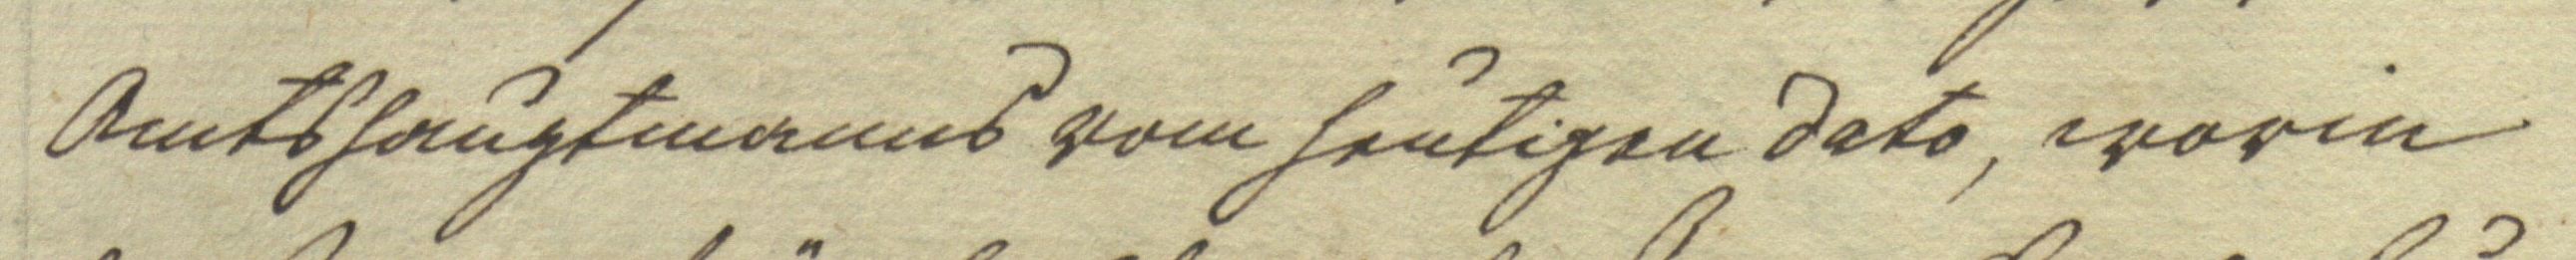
Amtshauptmanns vom heutigen dato, worin
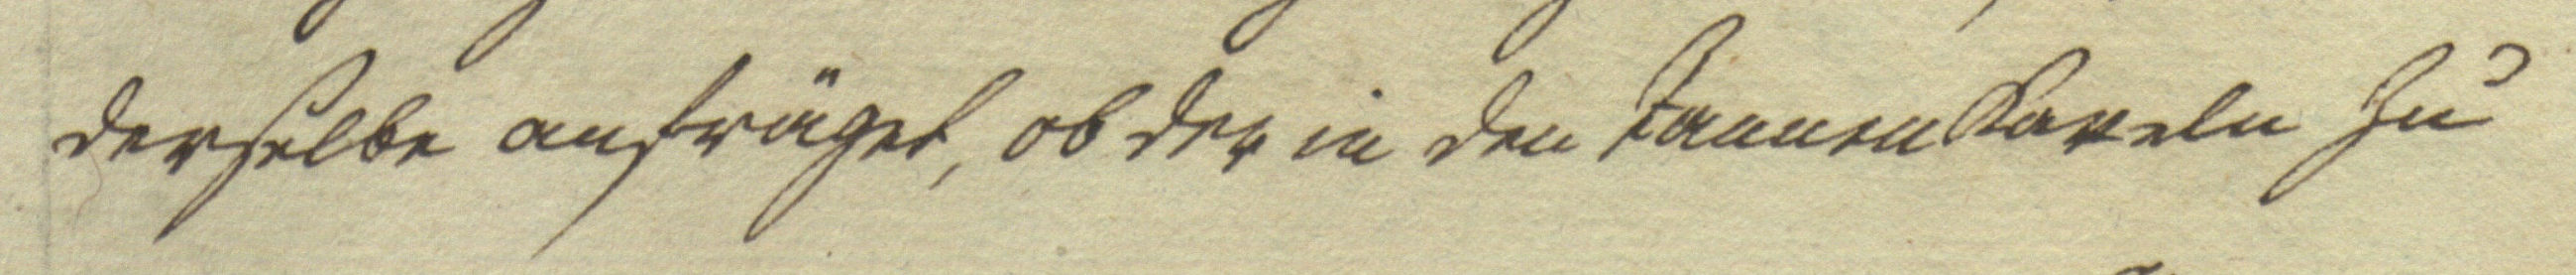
derselbe anfräget, ob der in den Tannenkaveln zu
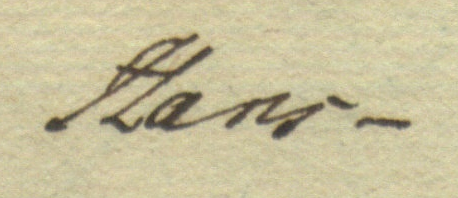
Hans-
